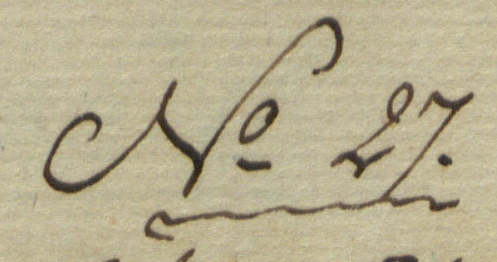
No 27 .
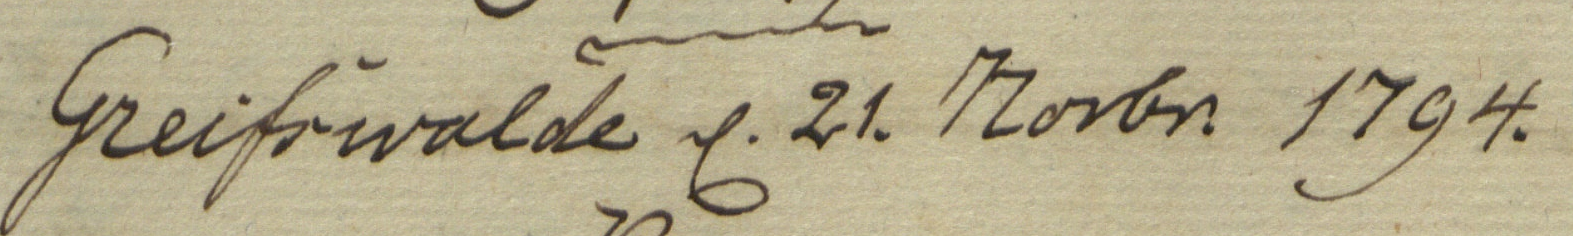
Greifswalde d. 21. Novbr. 1794.
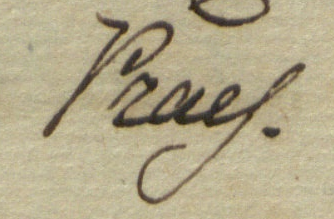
Praes.
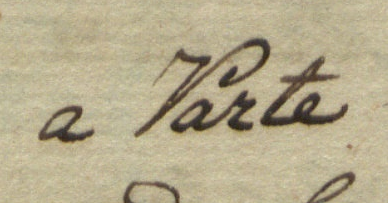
a Parte
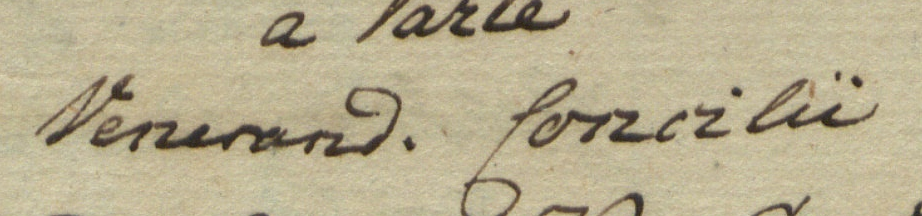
Venerand. Concilii
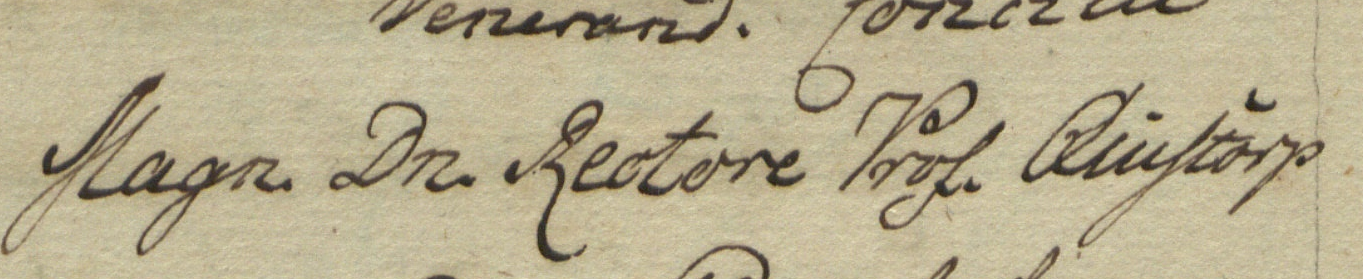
Magn. Dn. Rectore Prof. Quistorp
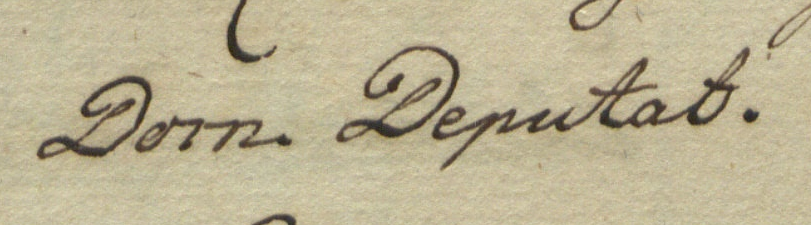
Dom. Deputat.
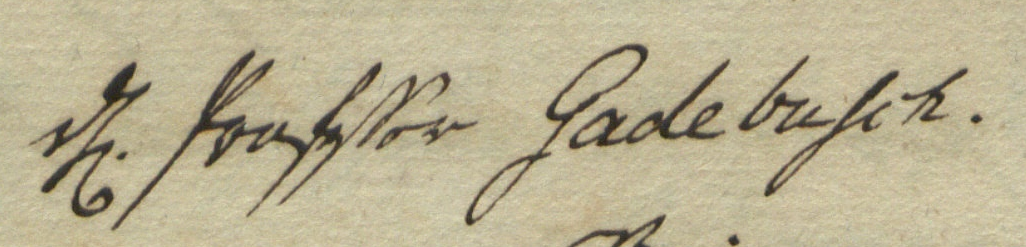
dh. Professor Gadebusch.
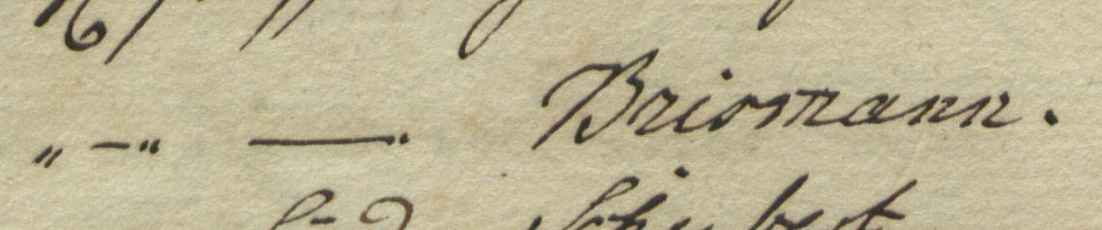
Brismann.
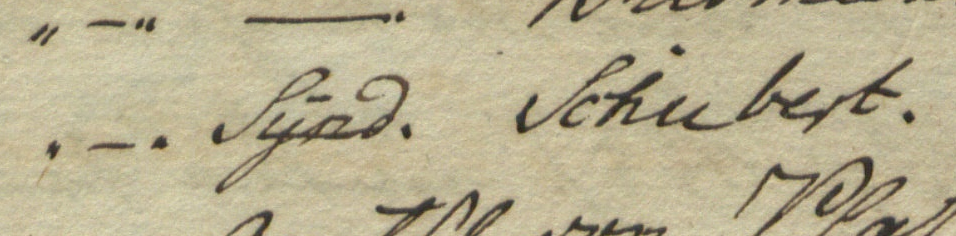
Sÿnd. Schubert.
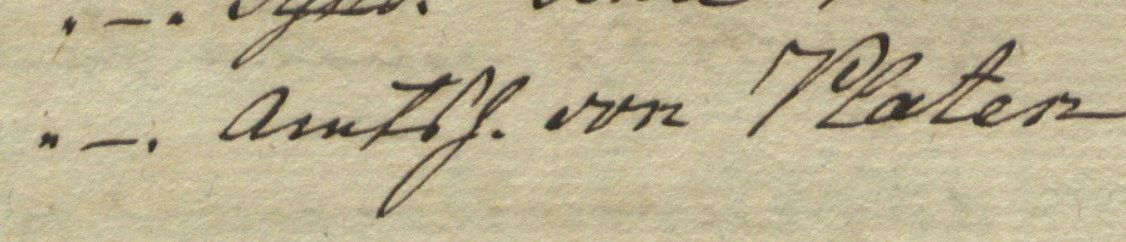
Amtsh. von Platen.
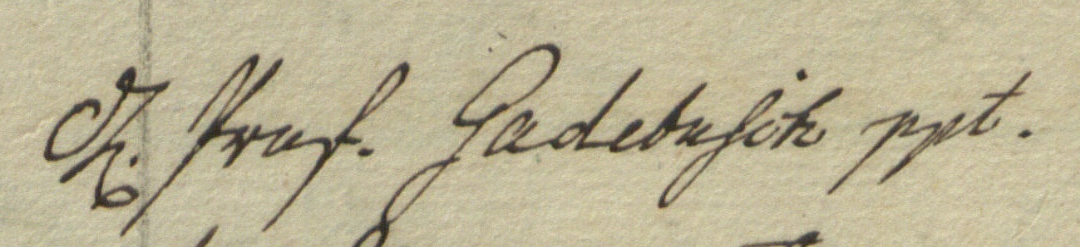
dh. Prof. Gadebusch ppt.
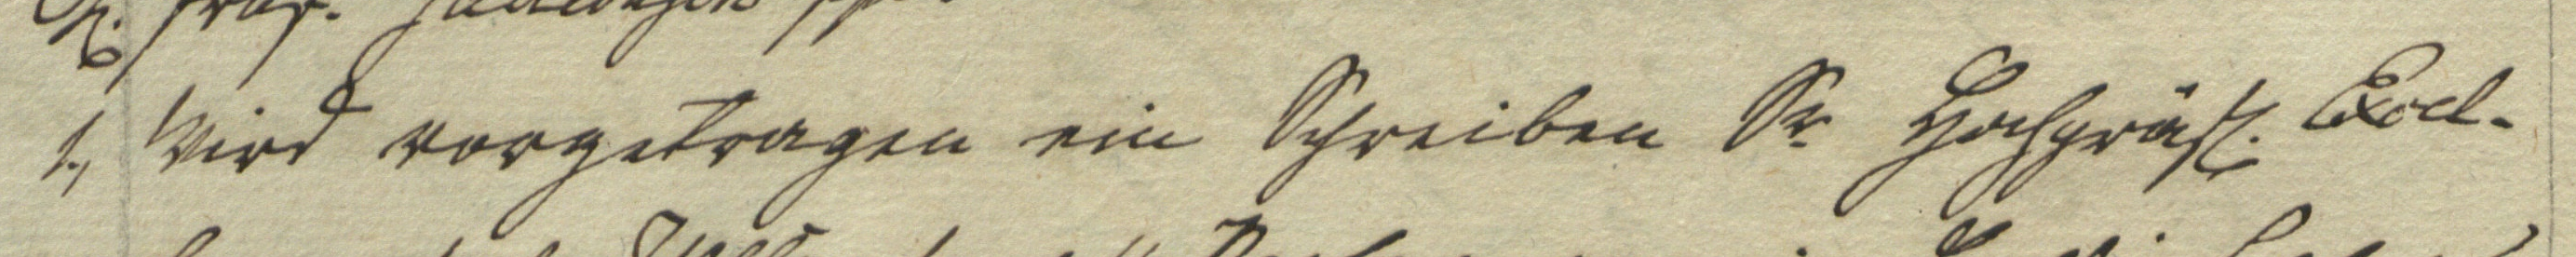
1., Wird vorgetragen ein Schreiben Sr Hochgräfl. Excel¬
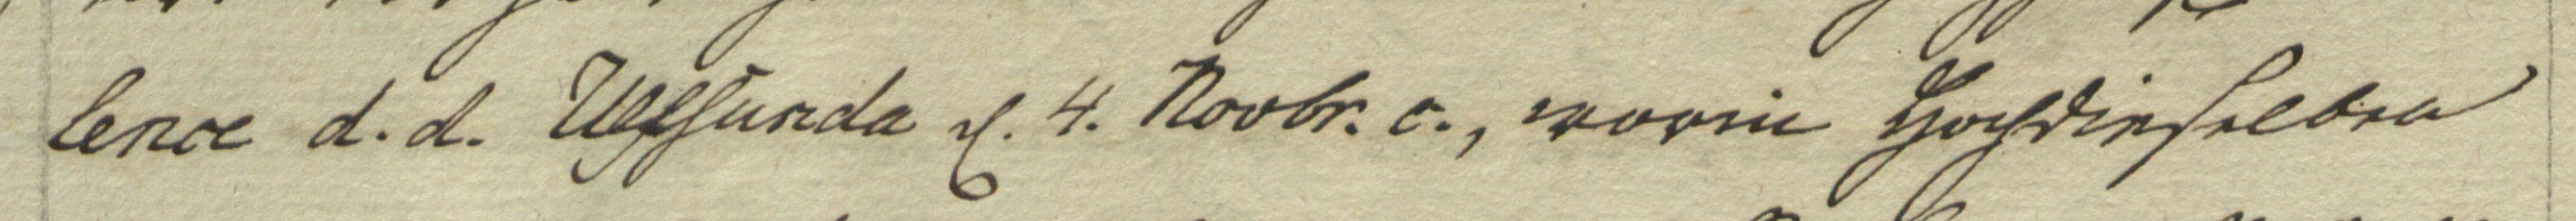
lence d. d. Ulfsunda d. 4. Novbr. c., worin Hochdieselben
